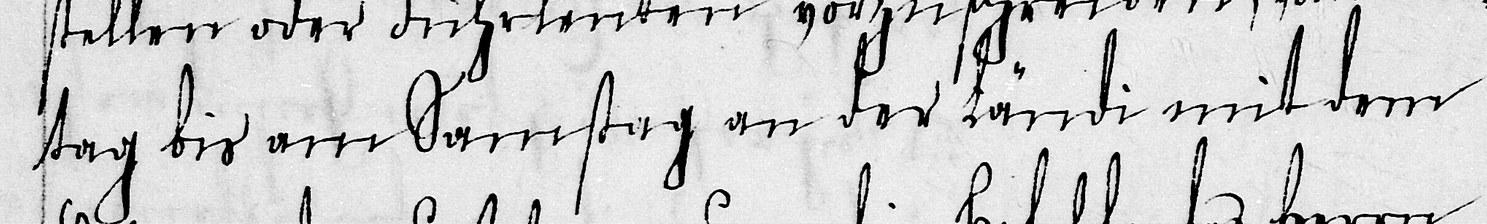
tag bis am Samstag an der Ländi mit dem
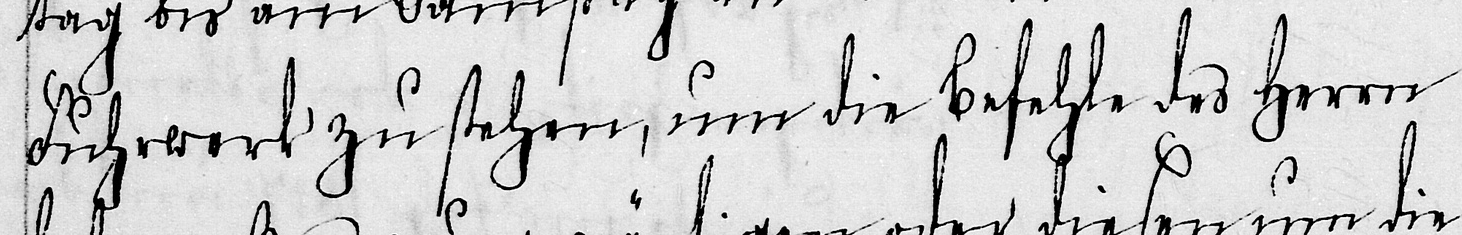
Fuhrwerk zu stehen, um die Befehle des Herrn
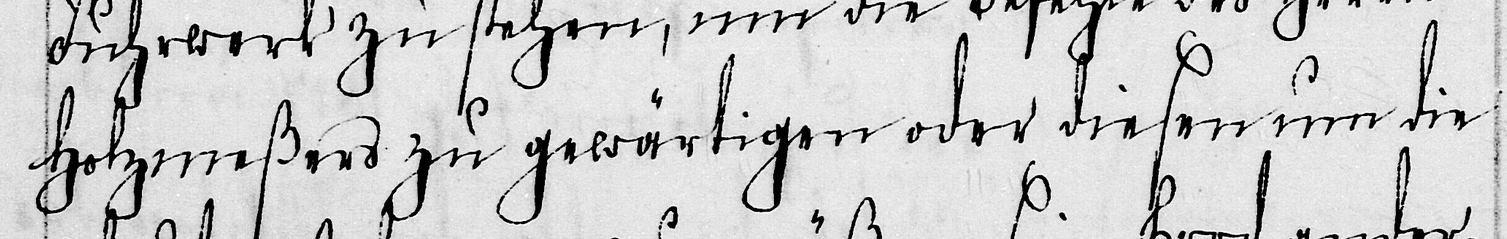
Holzmeßers zu gewärtigen oder diesen um die
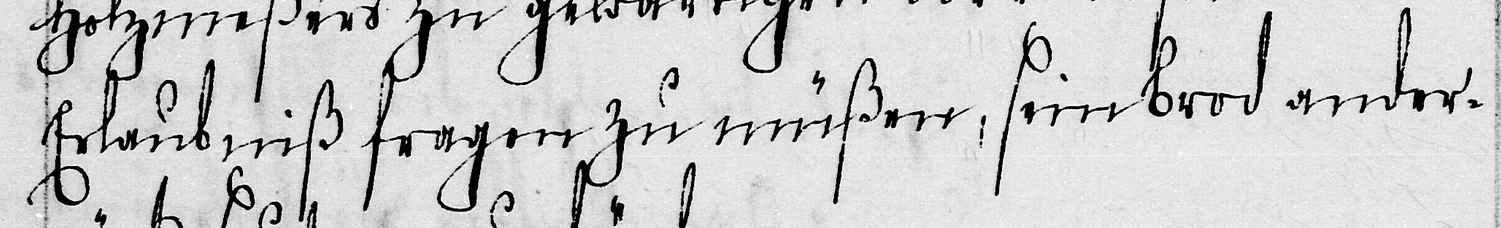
Erlaubniß fragen zu müßen, sein Brod ander¬
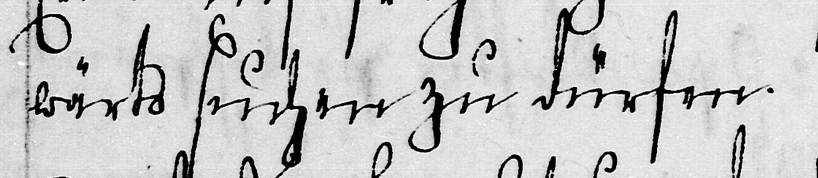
wärts suchen zu dürfen.
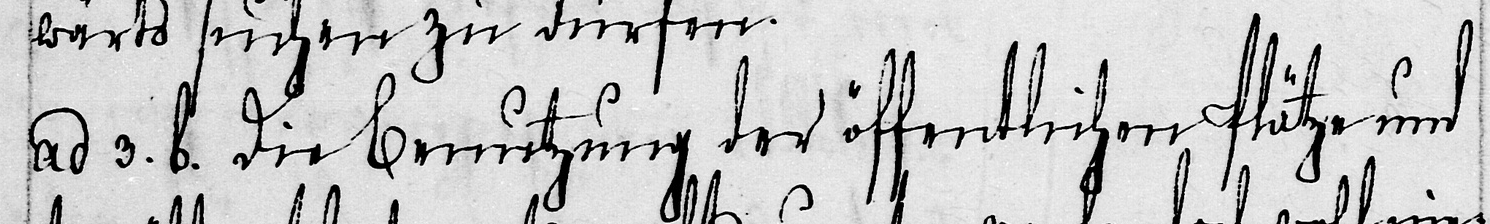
3. b. Die Benutzung der öffentlichen Plätze und
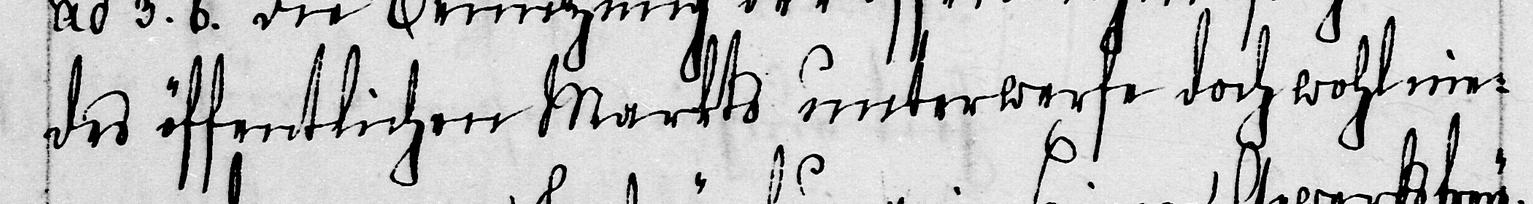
des öffentlichen Markts unterwerfe doch wohl nie¬
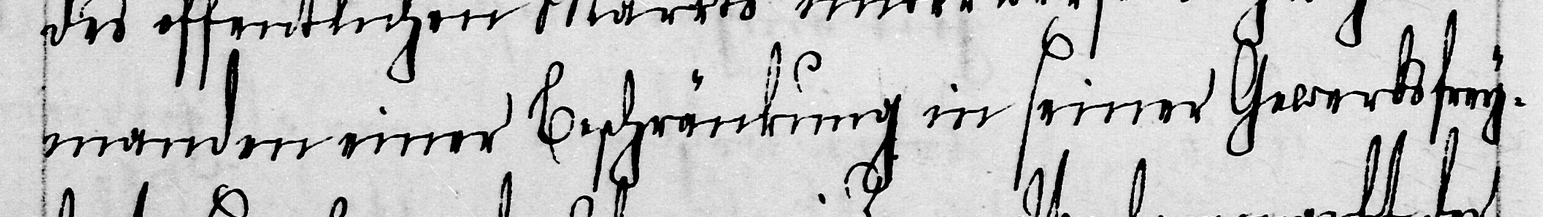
manden einer Beschränkung in seiner Gewerbsfrey¬
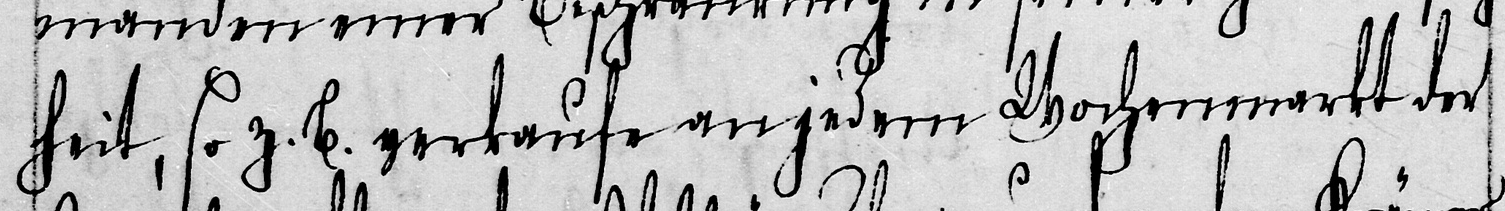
heit, so z. B. verkaufe an jedem Wochenmarkt der
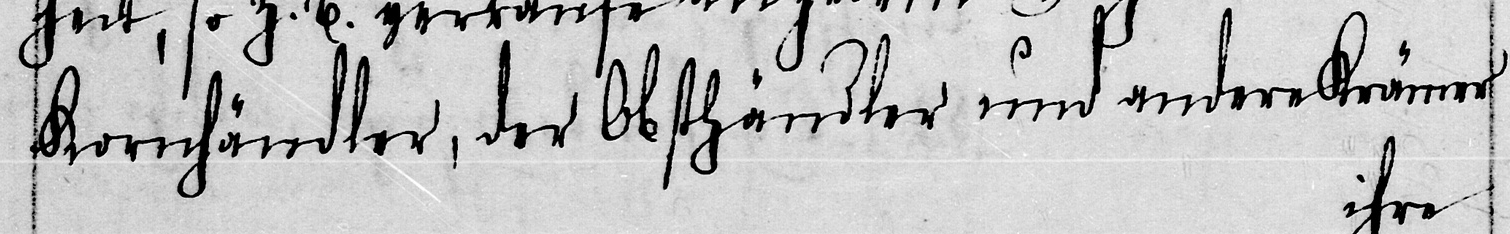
Kornhändler, der Obsthändler und andere Krämer
